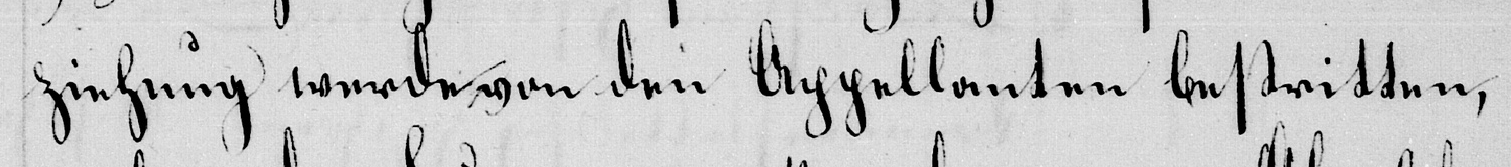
ziehung werde von den Appellanten bestritten,
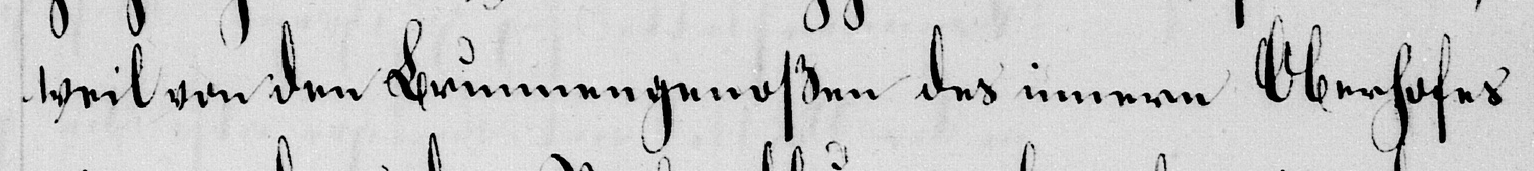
weil von den Brunnengenoßen des innern Oberhofes
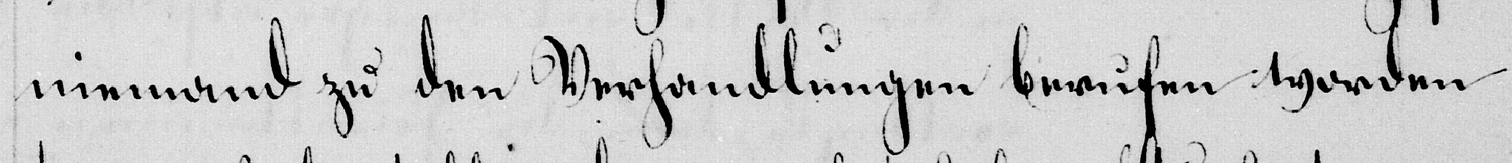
niemand zu den Verhandlungen berufen worden
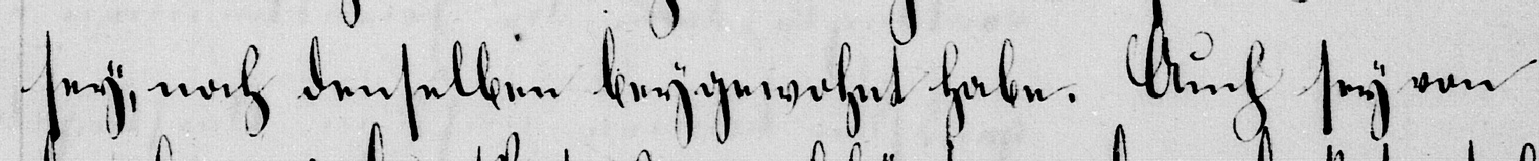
sey, noch denselben beygewohnt habe. Auch sey von
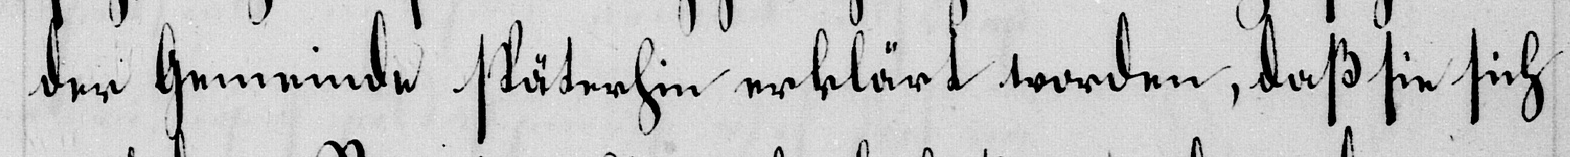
der Gemeinde späterhin erklärt worden, daß sie sich
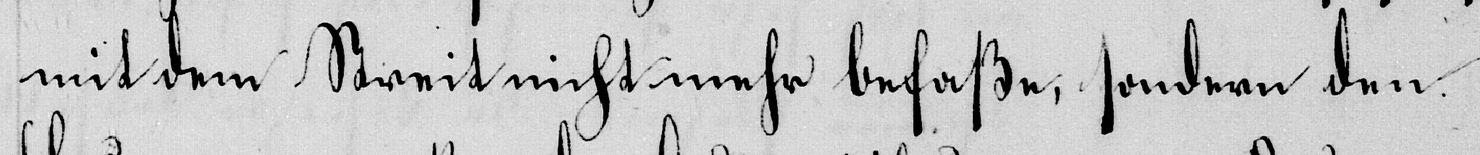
mit dem Streit nicht mehr befaße, sondern den
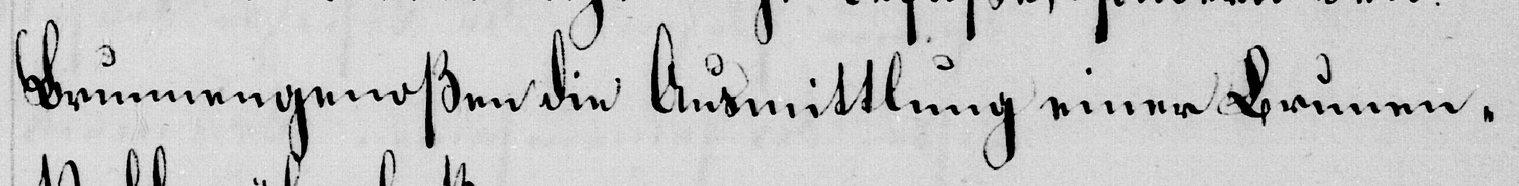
Brunnengenoßen die Ausmittlung einer Brunnen¬
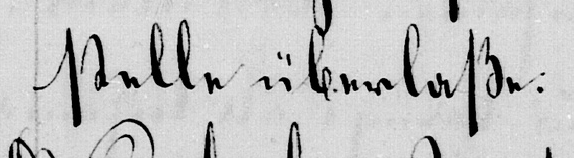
stelle überlaße.
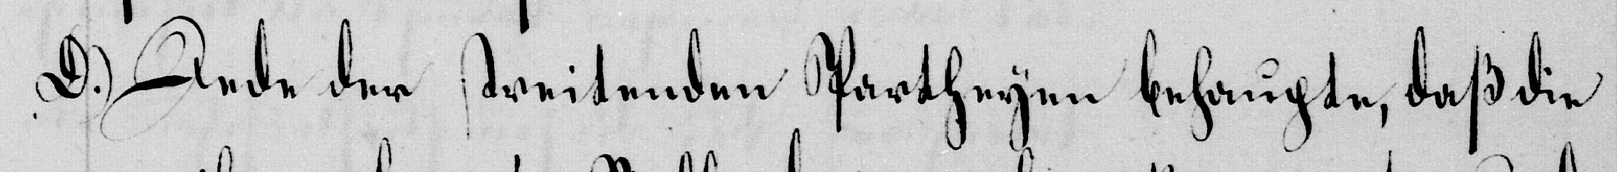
D.) Jede der streitenden Partheyen behaupte, daß die
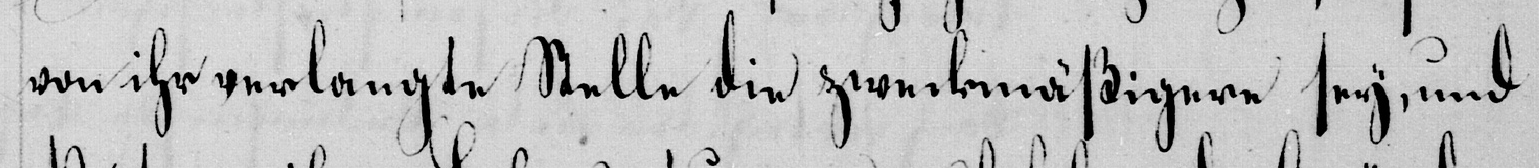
von ihr verlangte Stelle die zweckmäßigere sey, und
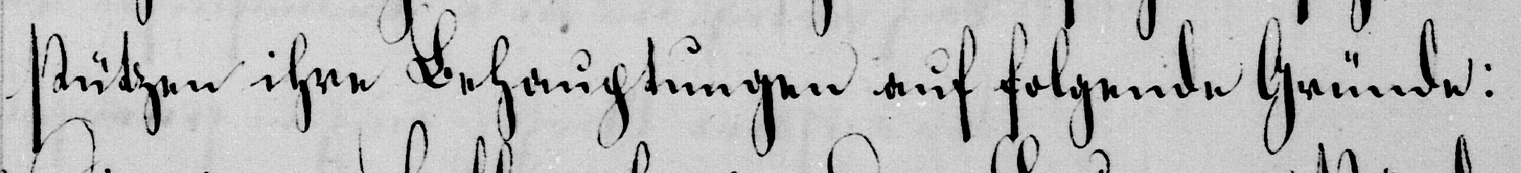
stützen ihre Behauptungen auf folgende Gründe:
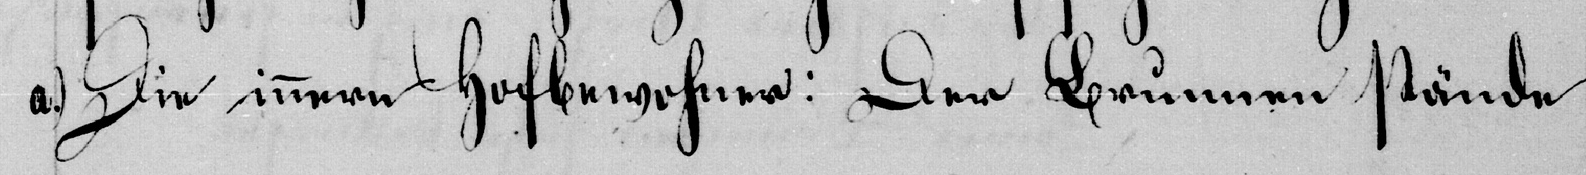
a.) Die innern Hofbewohner: Der Brunnen stände
